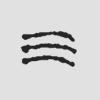三
